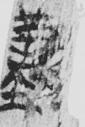難
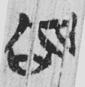含（今）
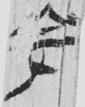宔（主）
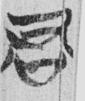君
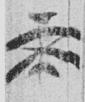不
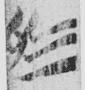於
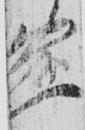○（吾）
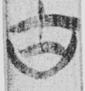古（故）
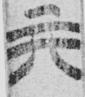而
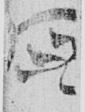反
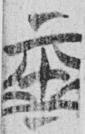亞（惡）
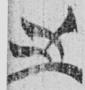之
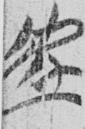○（吾）
